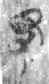𠭁
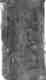閟（閉）
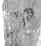夕
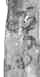啟
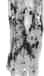朝
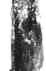○（得）
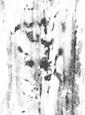○（得）
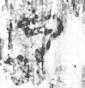夕
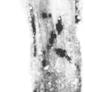不
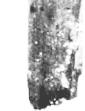○（得）
